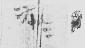九十=
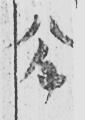{八千}
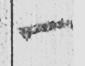一
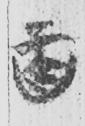百
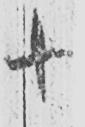七
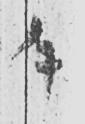千
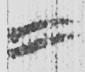二
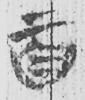百
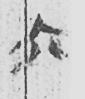六
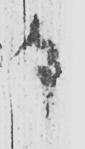千
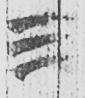三
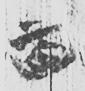百
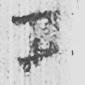五
